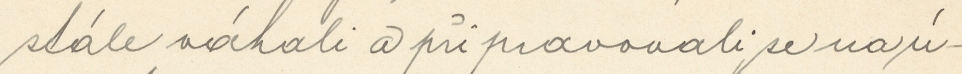stále váhali a připravovali se na ú-
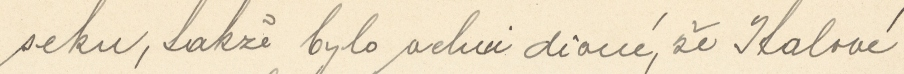seku, takže bylo velmi divné, že Italové
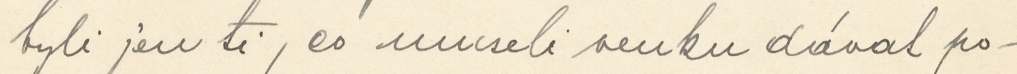byli jen ti, co museli venku dávat po-
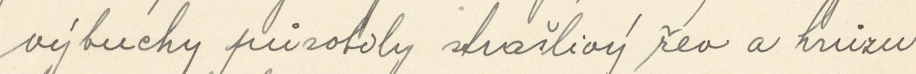výbuchy působily strašlivý řev a hrůzu.
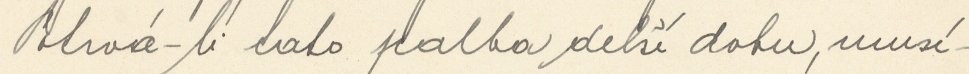Potrvá-li tato palba delší dobu, musí-
